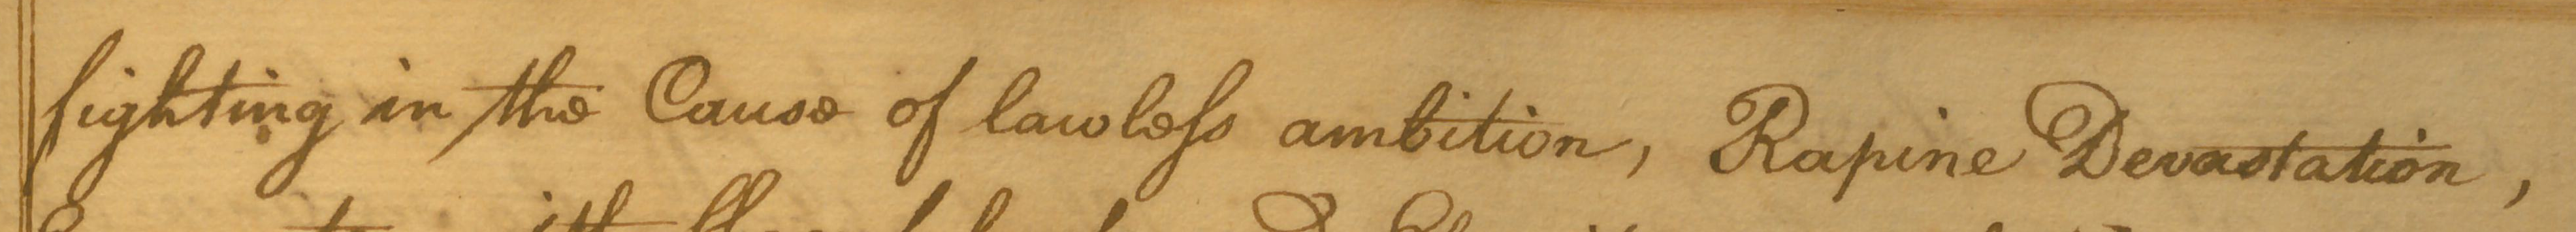fighting in the Cause of lawless ambition, Rapine Devastation,
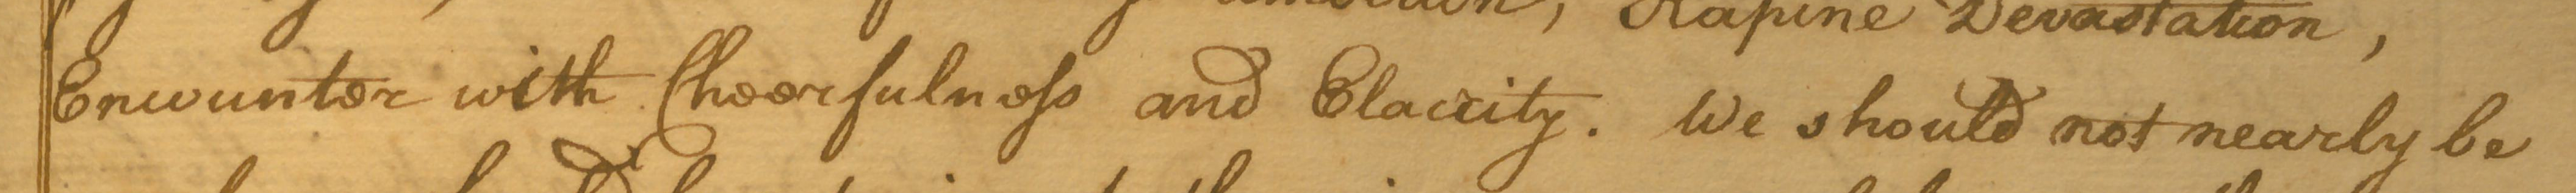Encounter with Cheerfulness and Clarity. We should not nearly be
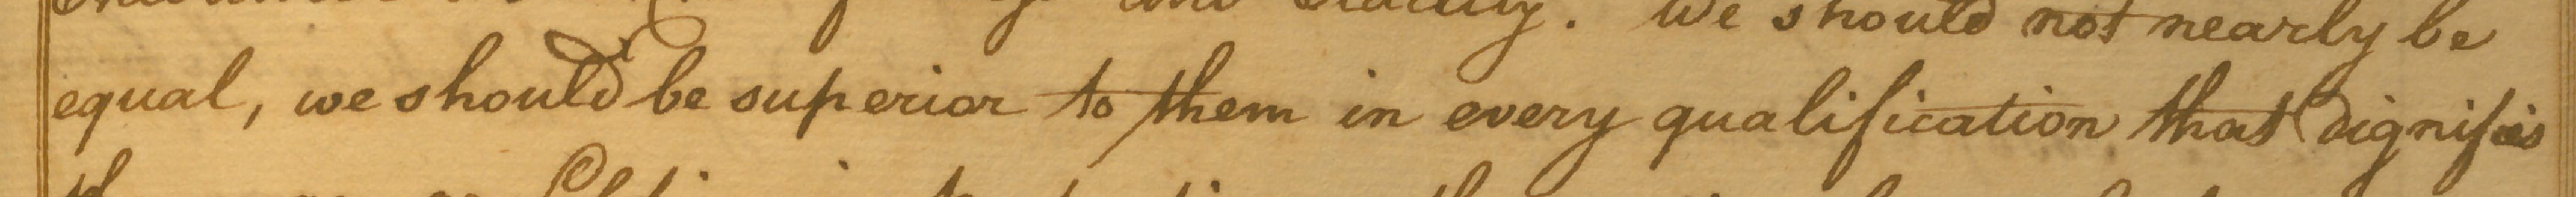equal, we should be superior to them in every qualification that dignifies
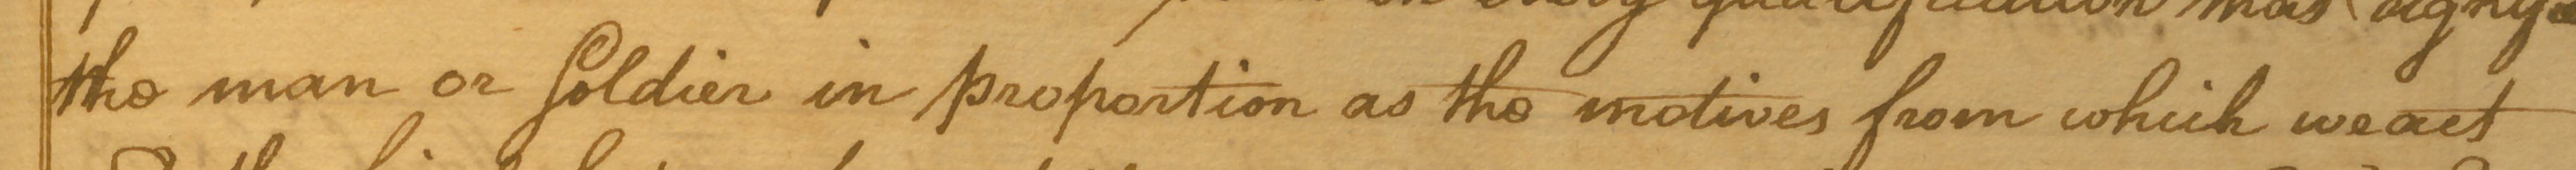the man or soldier in proportion as the motives from which we act
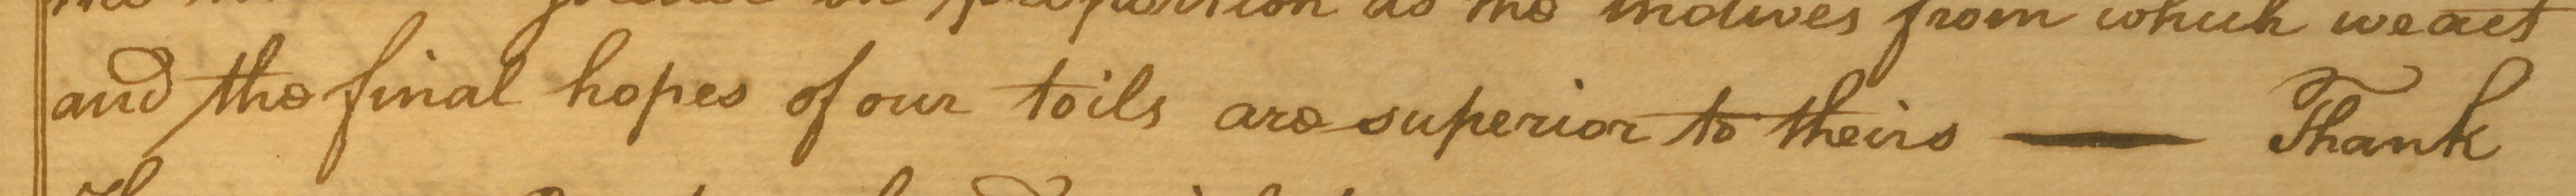and the final hopes of our toils are superior to theirs- Thank
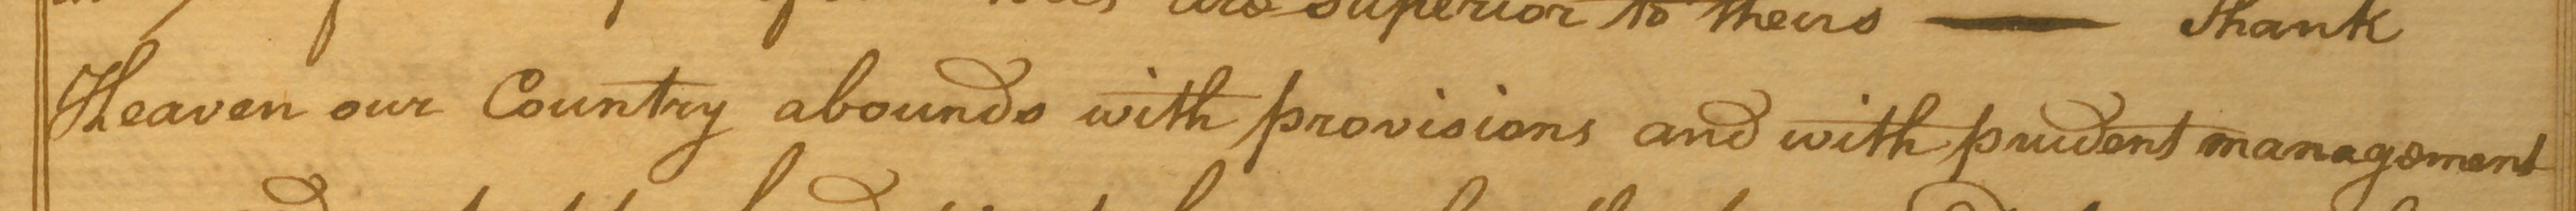Heaven our Country abounds with provisions and with prudent management
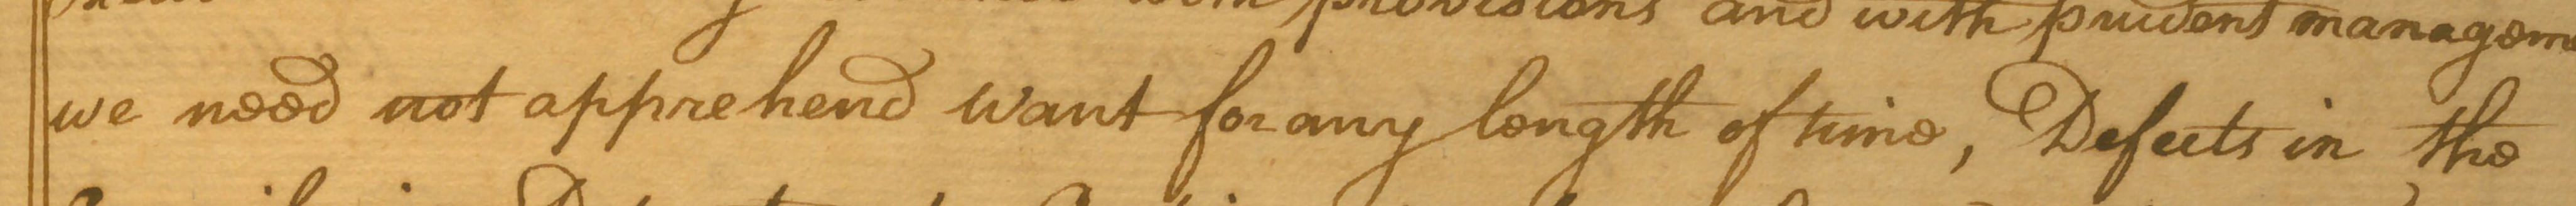we need not apprehend want for any length of time, Defects in the
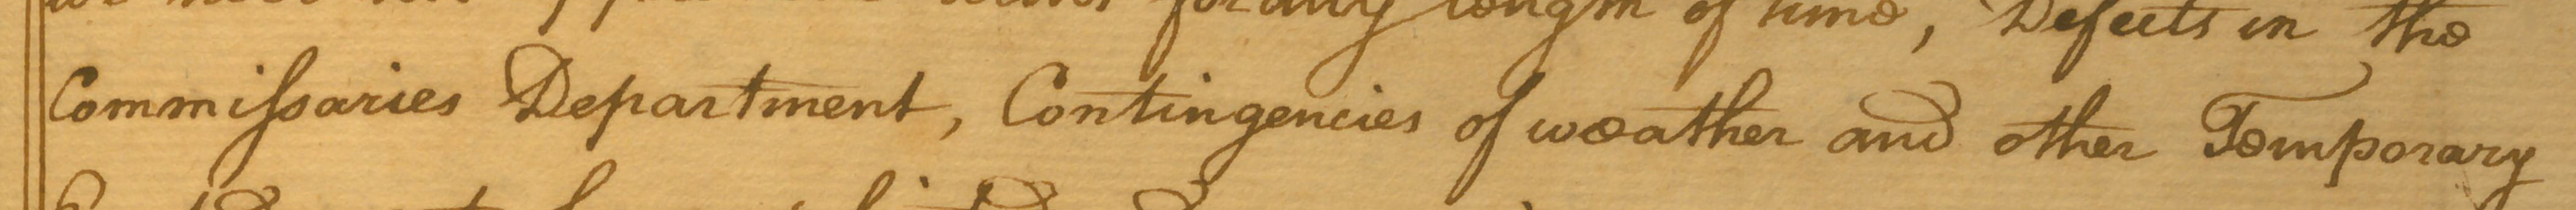Commissaries Department, Contingencies of weather and other Temporary
